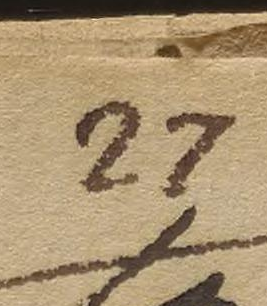27
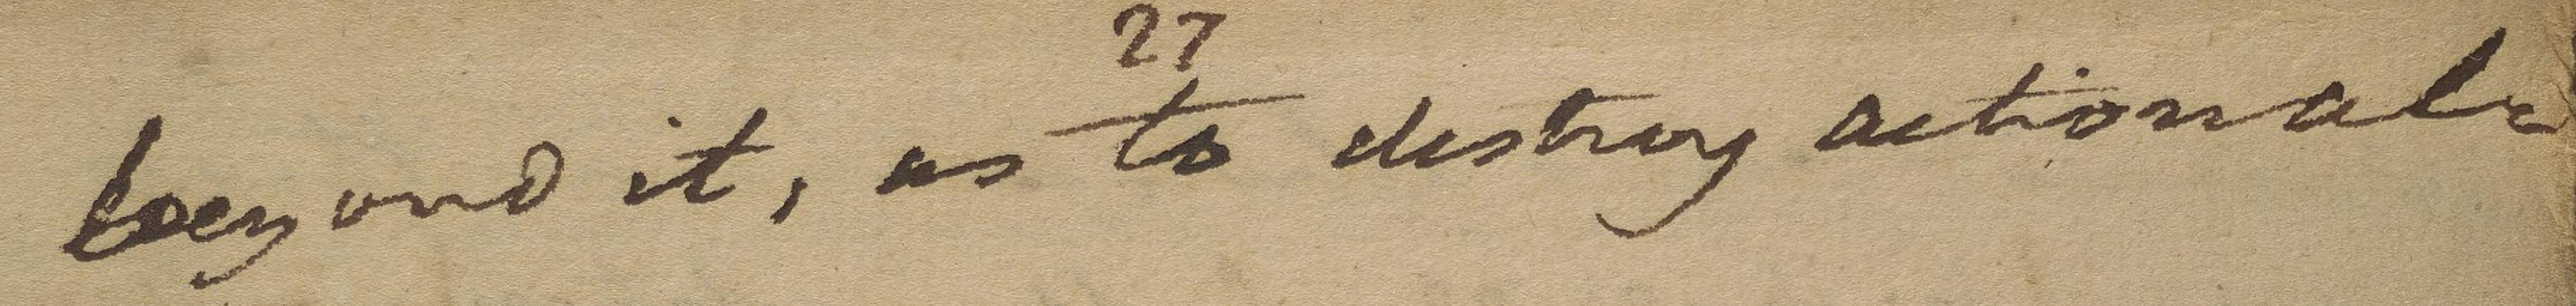beyond it, as to destroy action al-
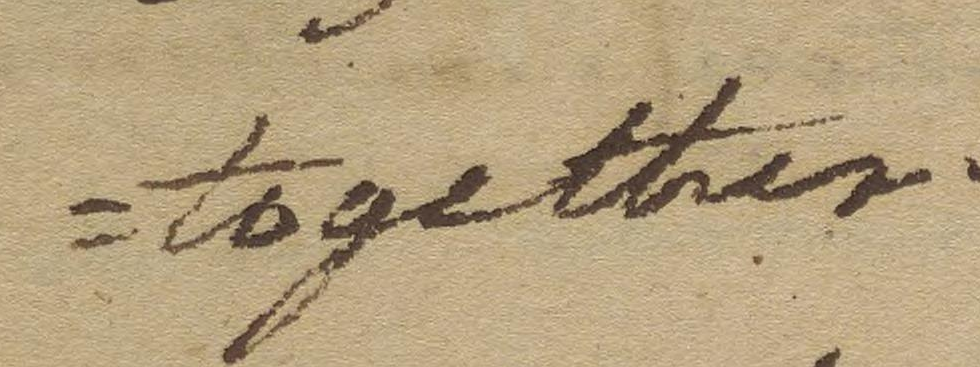-together.
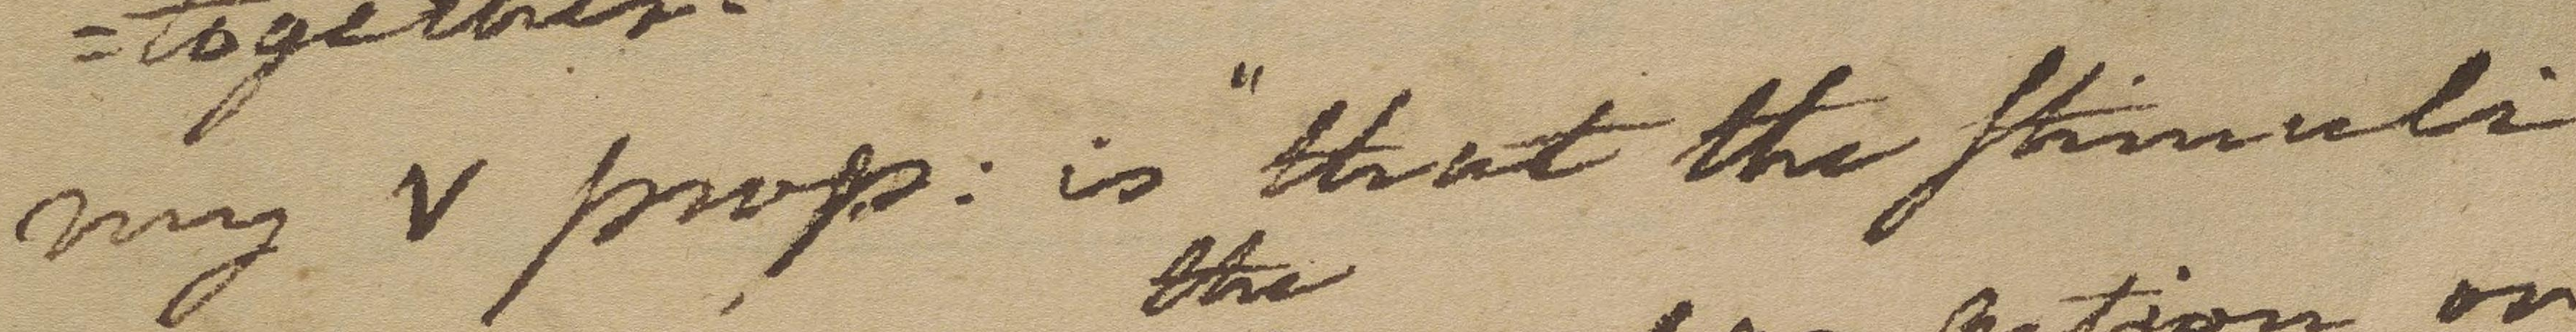my V prop: is "that the stimuli
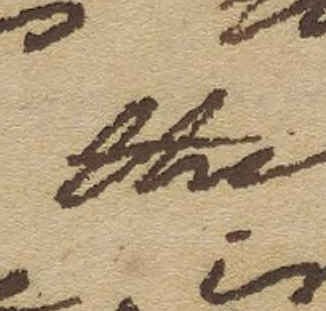the
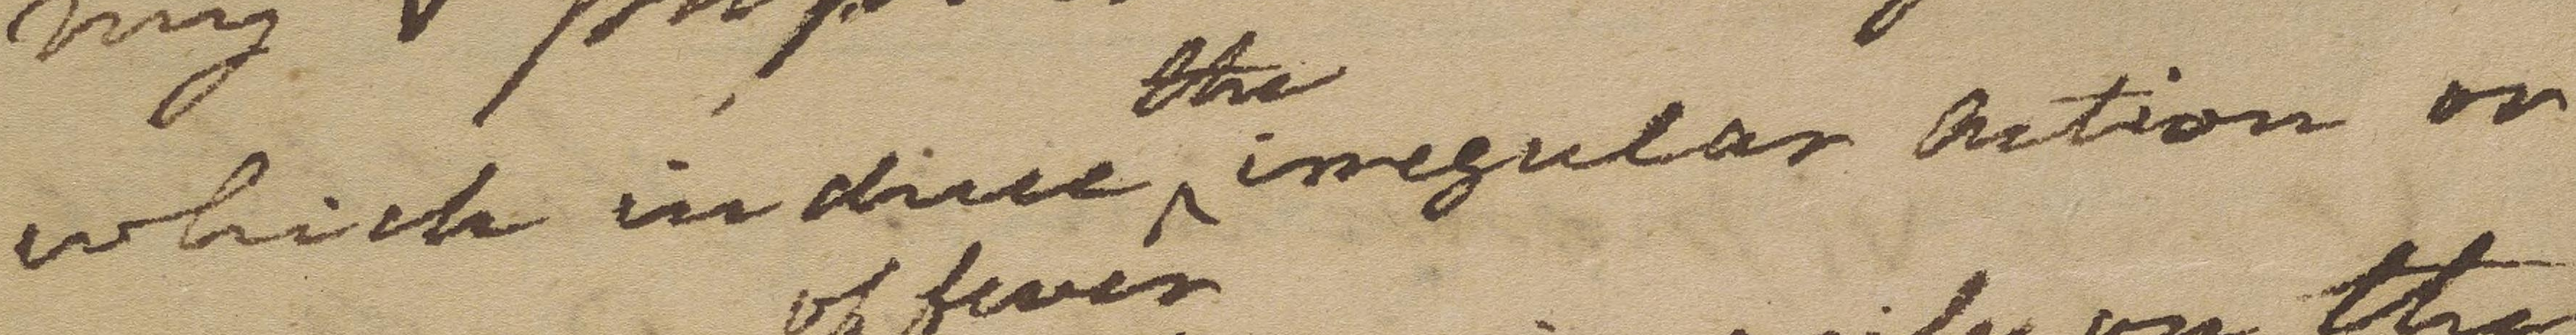which increase ^ irregular action or
